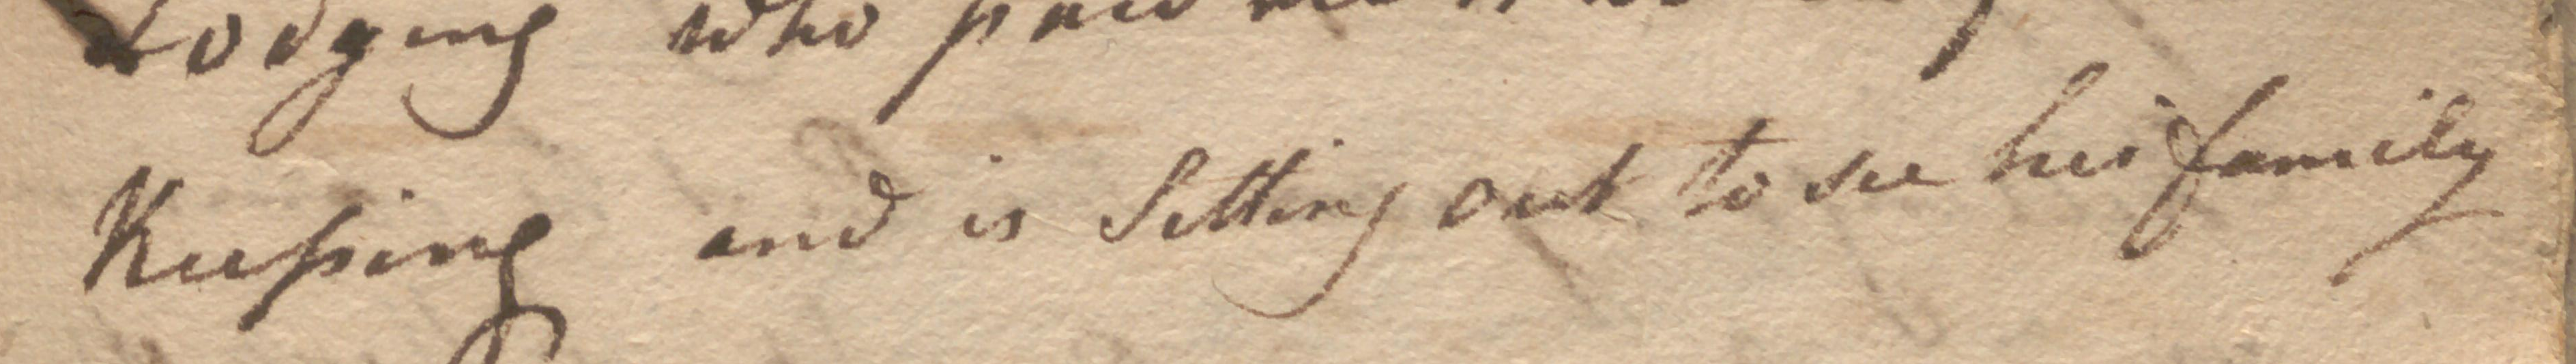Keeping and is Setting out to see his family
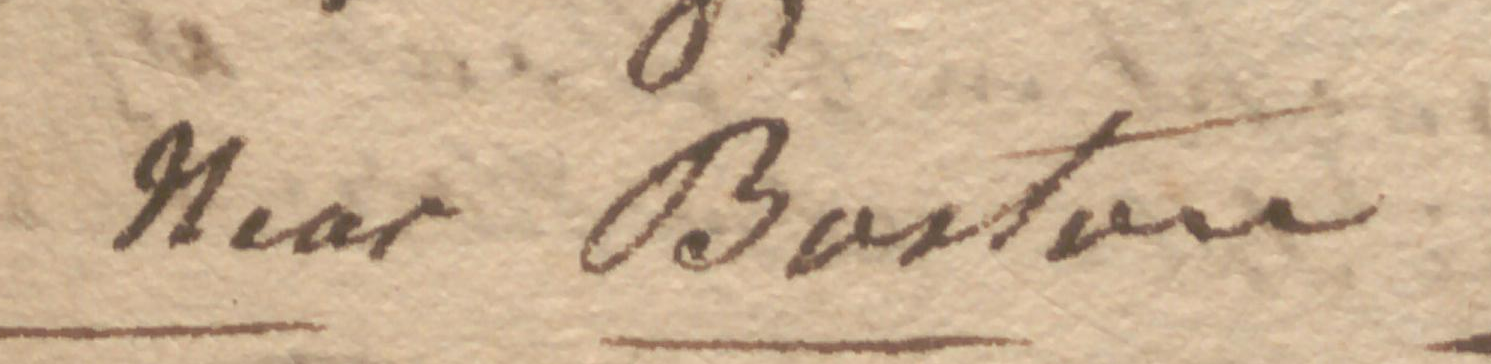Hear Boston
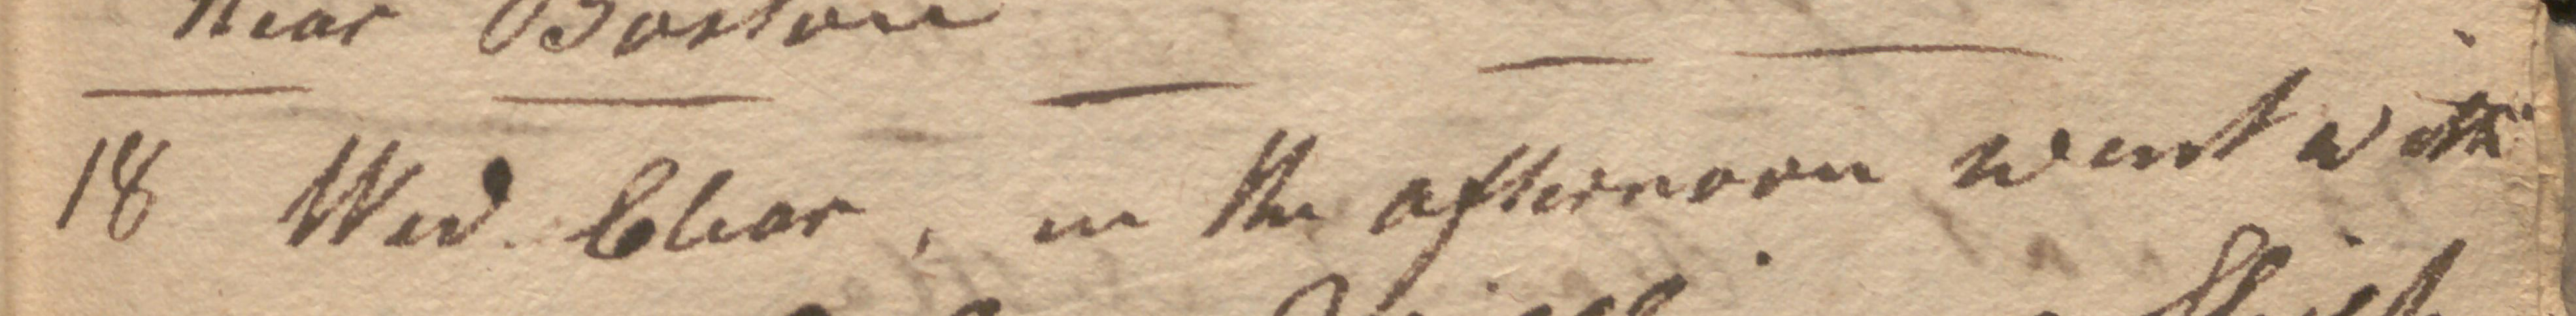18 Wed. Clear, in the afternoon went with
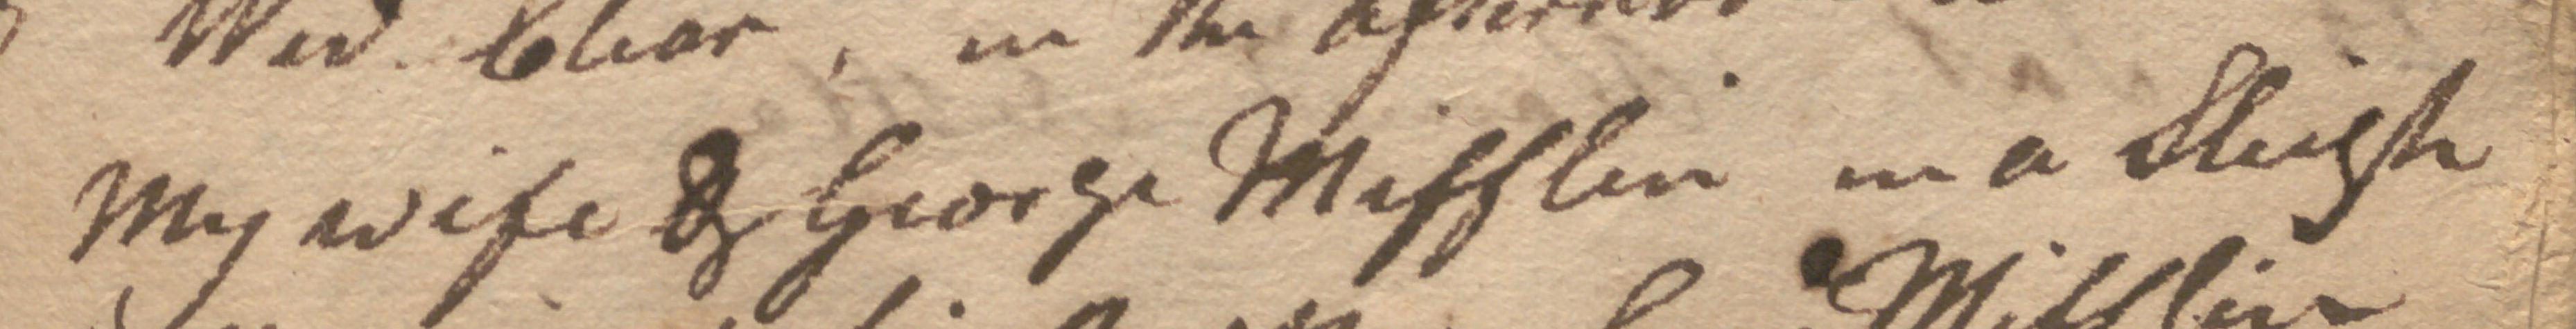My wife & George Mifflin in a Sleigh
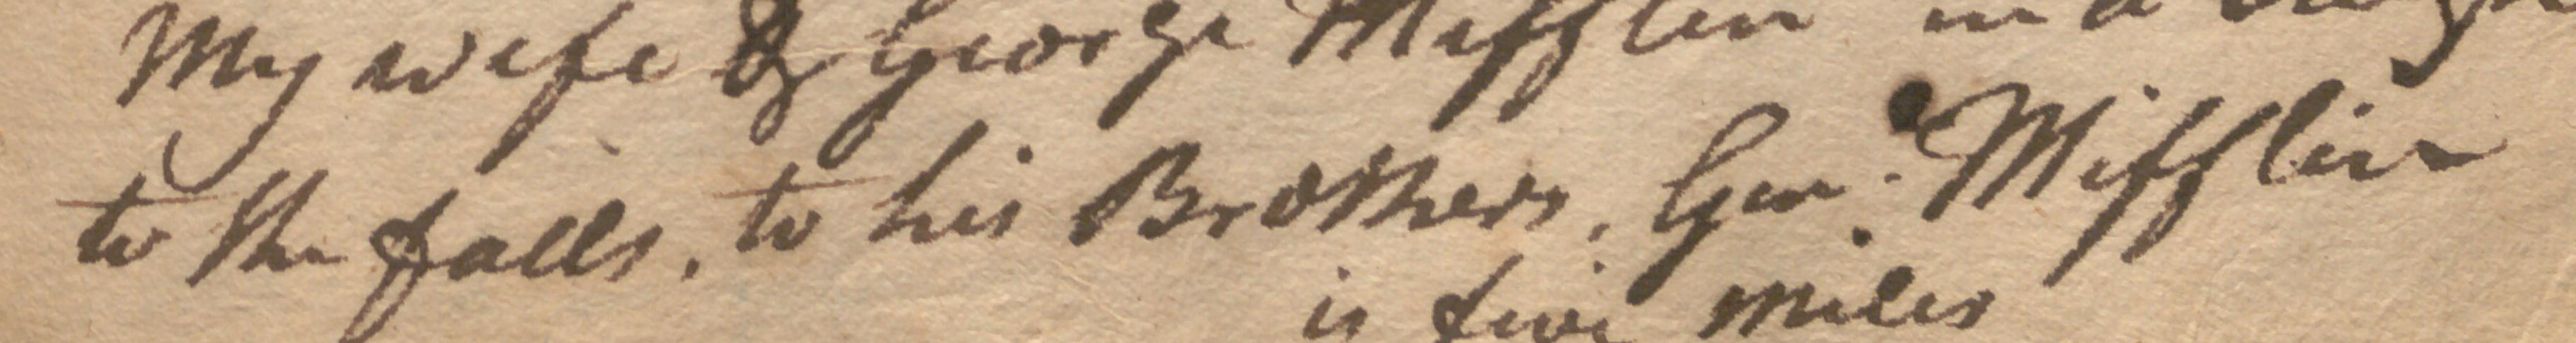to the falls, to his Brothers. Gen^l. Mifflin
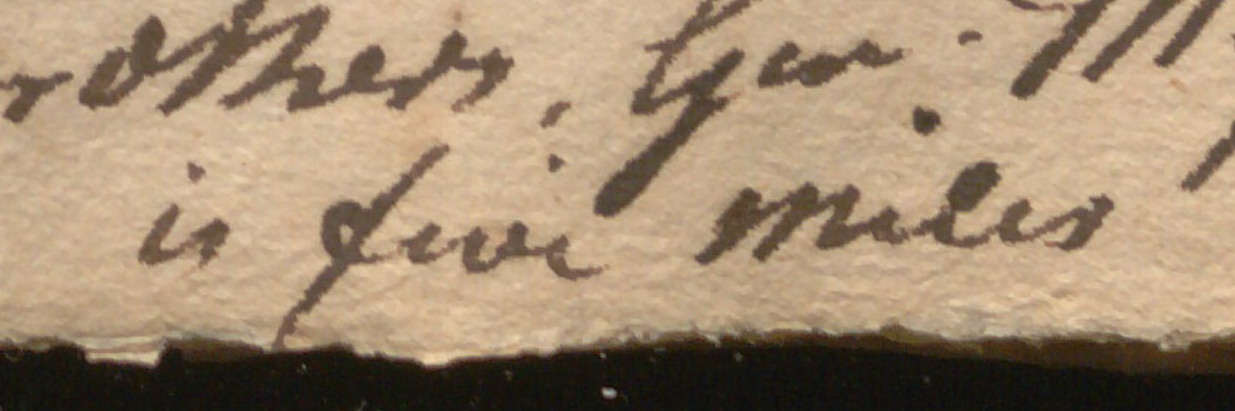is five miles
